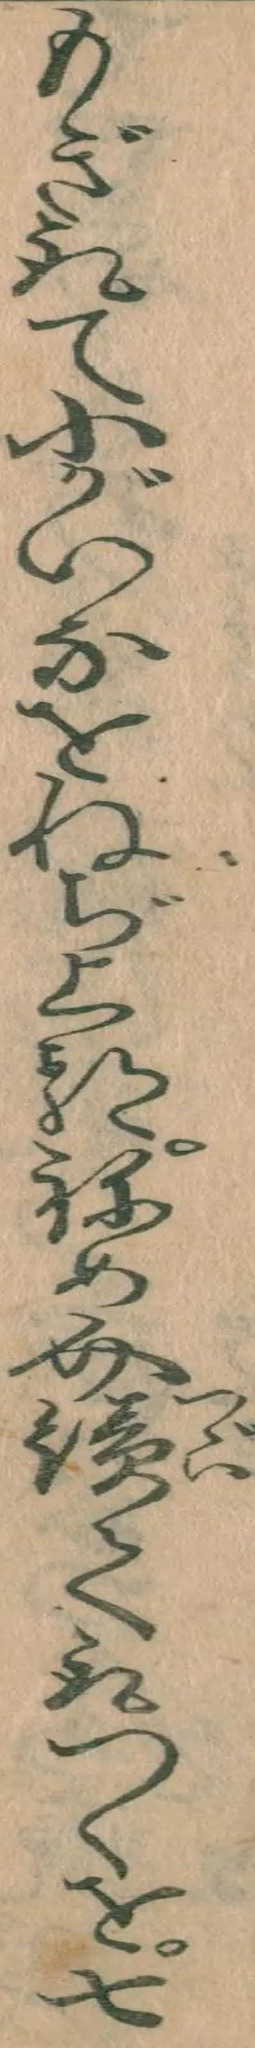もぎ取て小がいなをねぢ上る。ねめ介続て取つくを。七
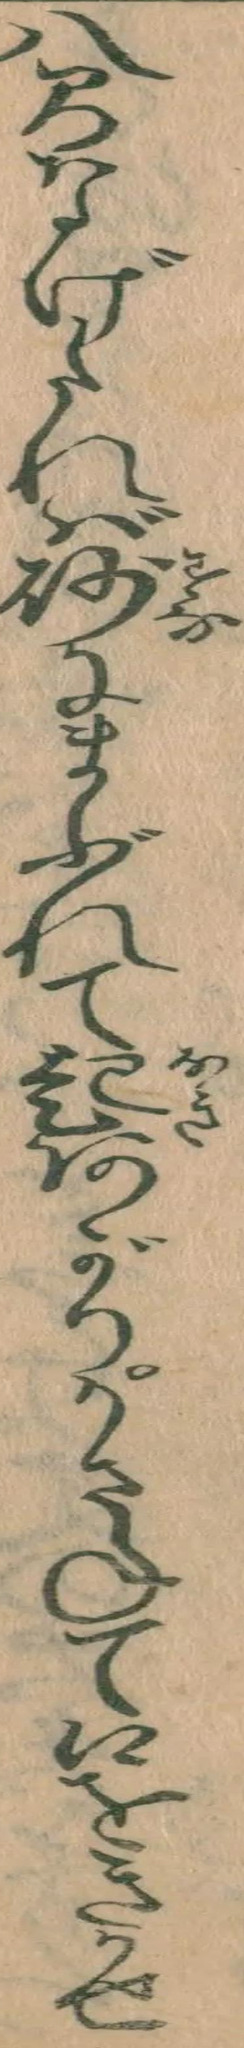八間なげたれば砂にまぶれて起あがり。かさねて口をきかせ
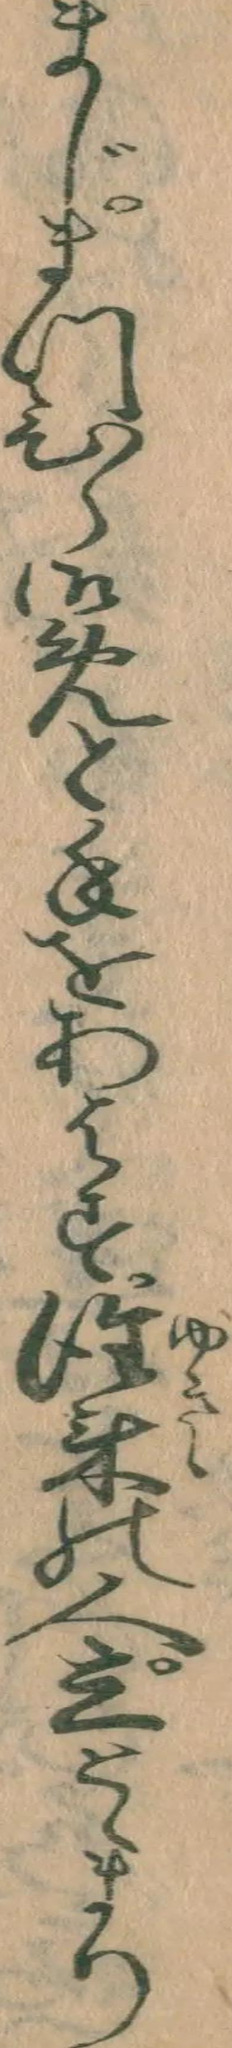まじ。まつひら御免と手をあはす。往来の人。立とゝまり
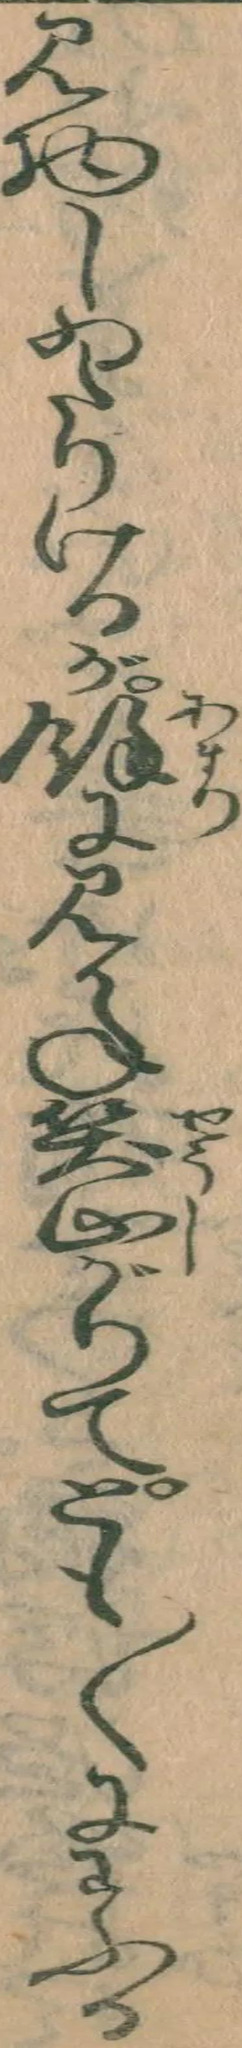見物しゐたりけるが。余に見かね笑止がりて。とも〳〵にわふる
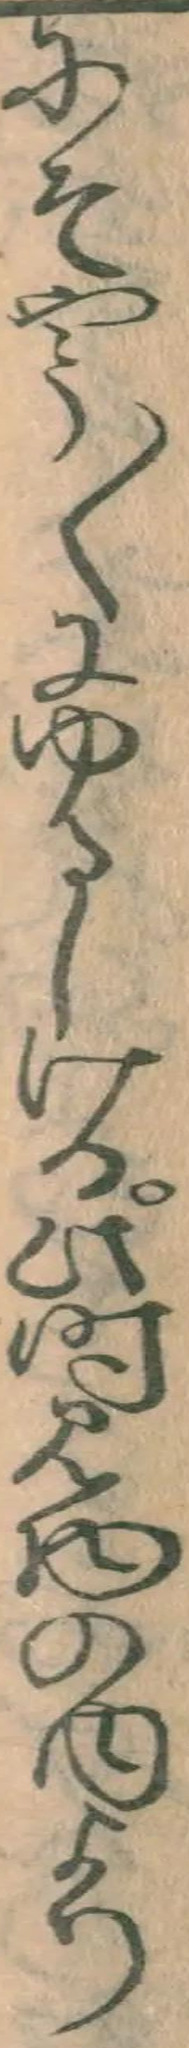にそやう〳〵にゆるしける。此時見物の内より
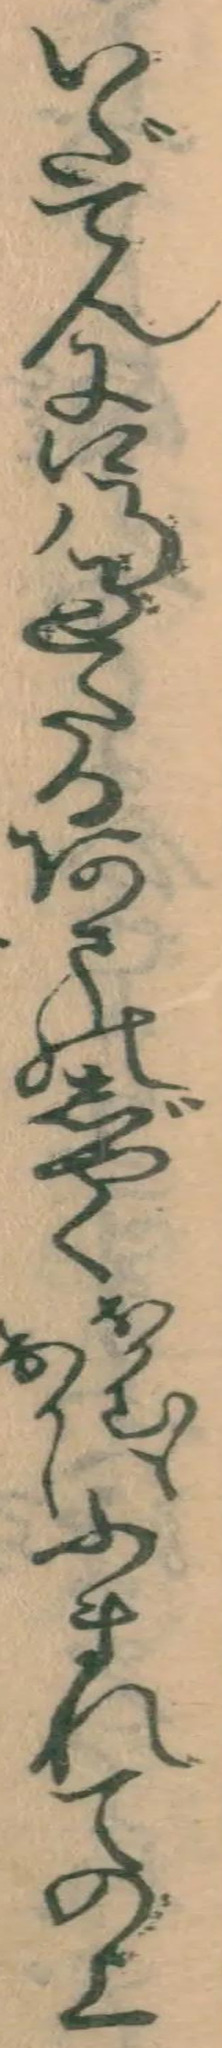いだてんに口の過たるあまのじやくほかむもおかしふまれての上
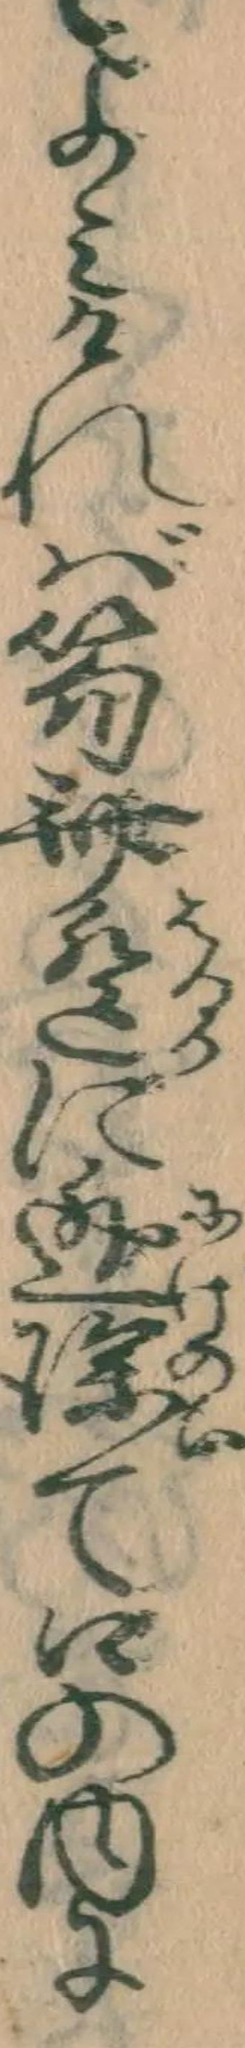とよみければ筍斎遥に逃除て口の内に
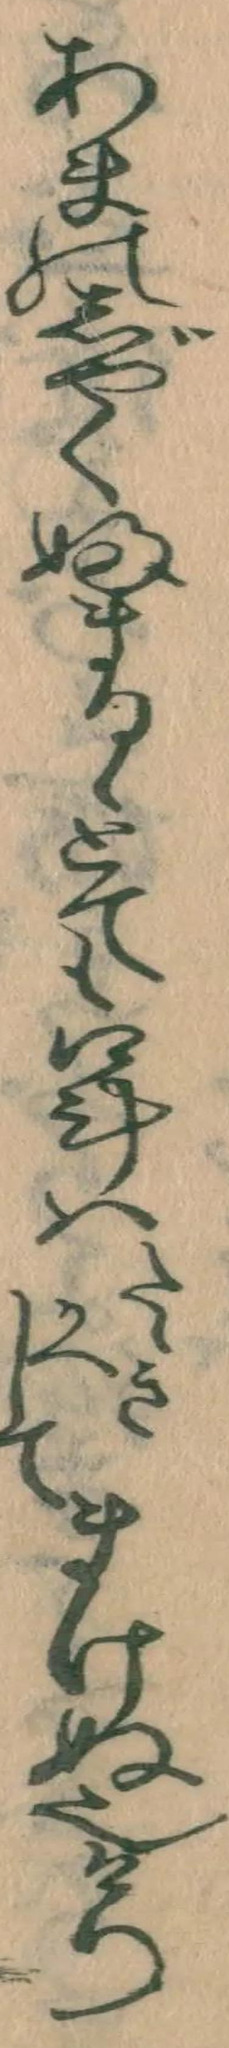あまのじやくふまるゝとても口計はたゝきかへしてまけぬ也けり
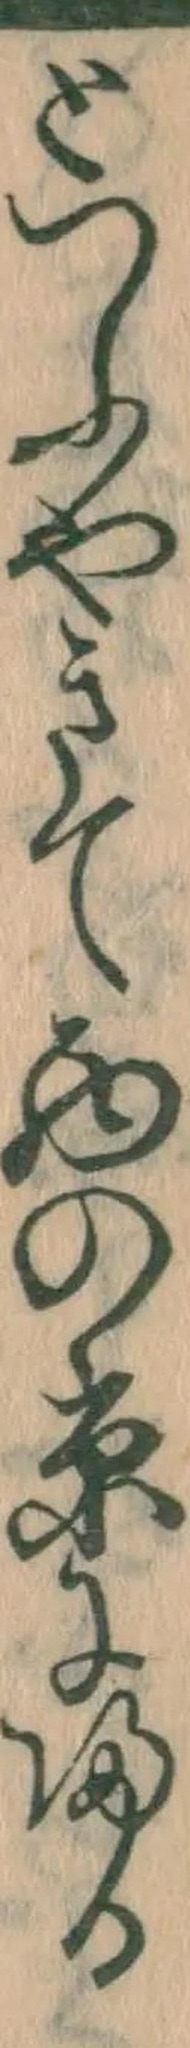とつふやきて西の京に帰る
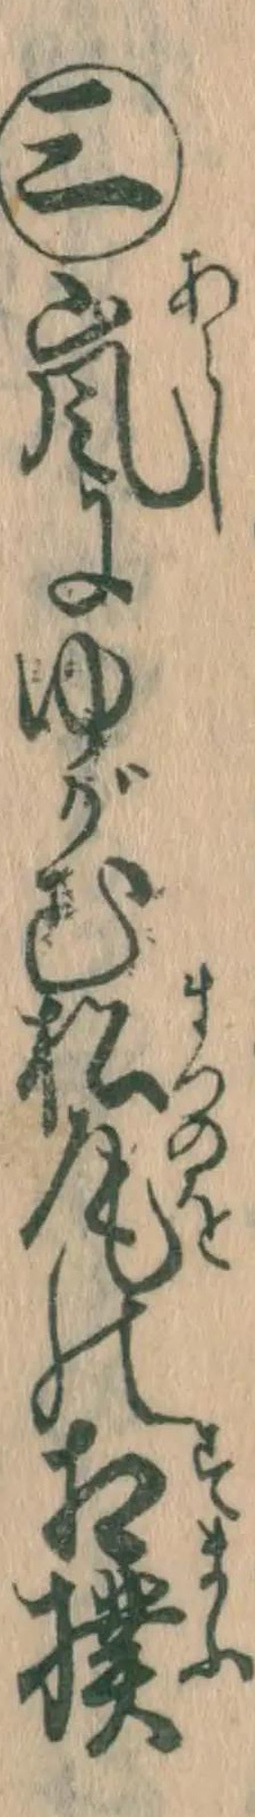三嵐にゆがむ松尾の相撲
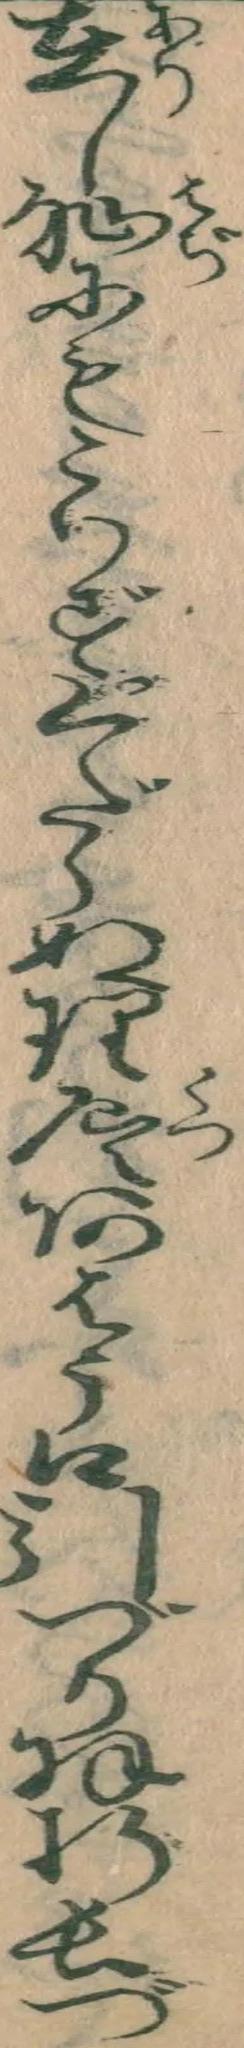在し恥にもこりず。くだらぬ理屈あはう口引づり羽折長づ
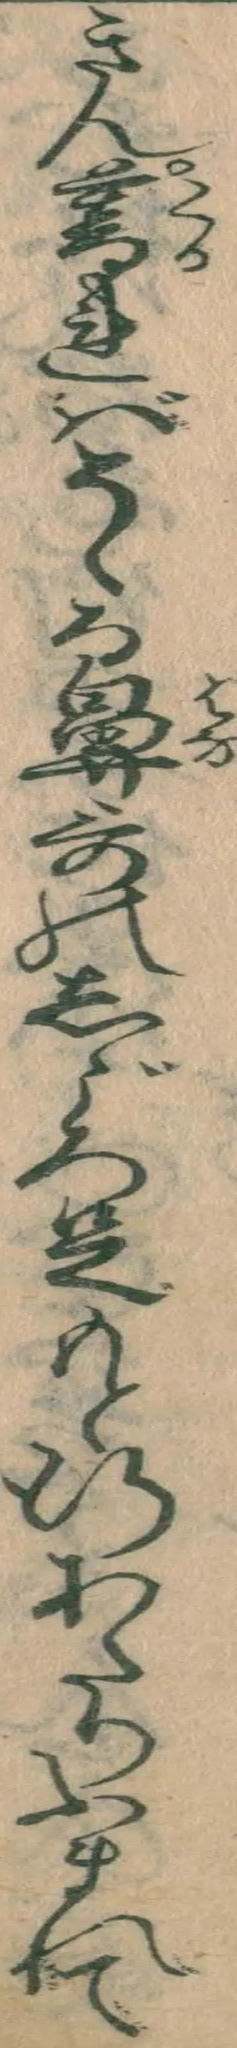きん。暮ればそゝる鼻歌のしどろ足もと行あたりふまれて
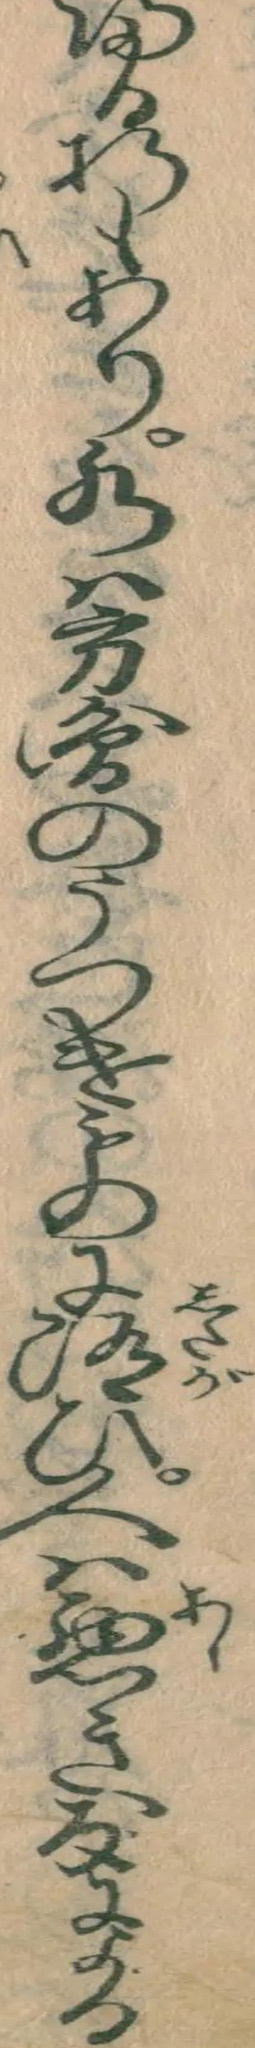帰る折もあり。水は方円のうつけものに随ひ。人は悪き友による
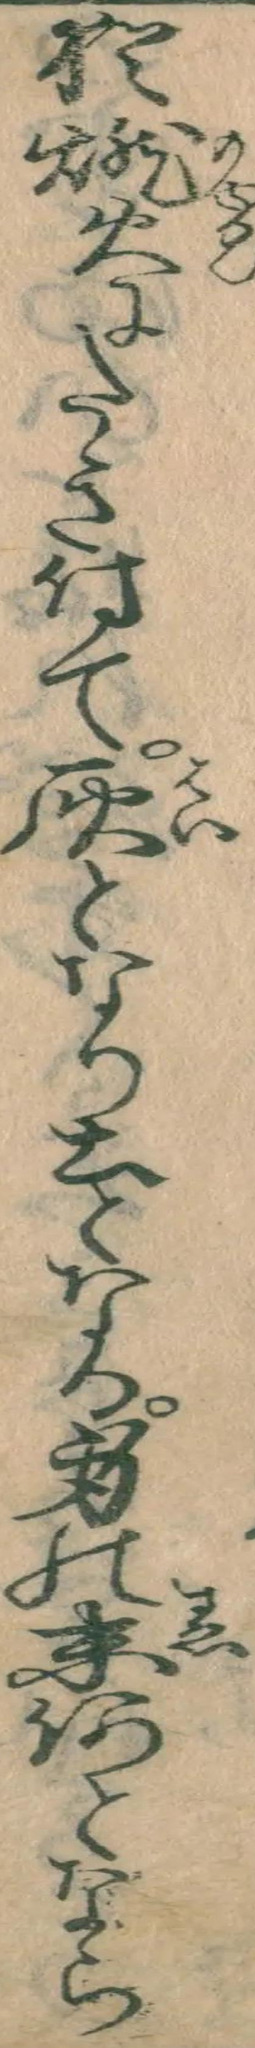猶燃火にたき付て。灰となり土となる。身の末何となら
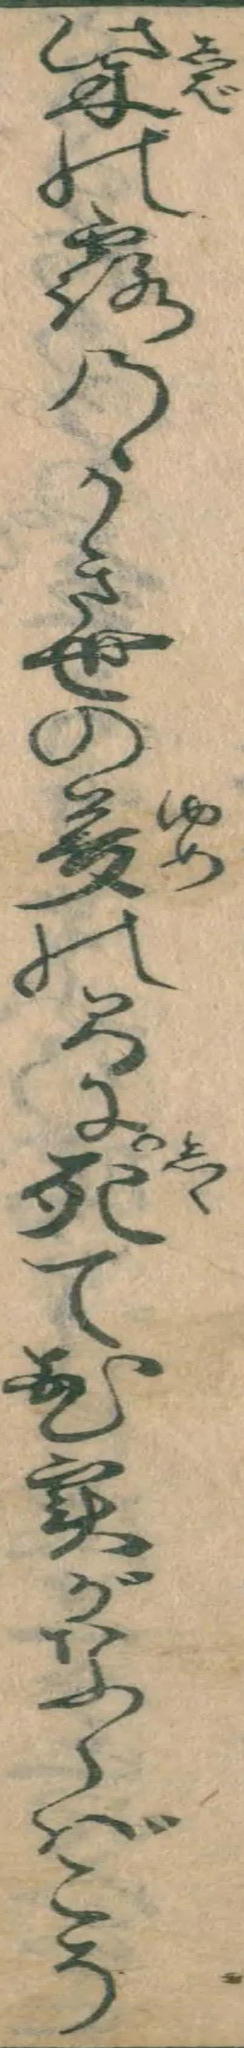柴の露のうき世の夢の間に。死て花実がならばこそ
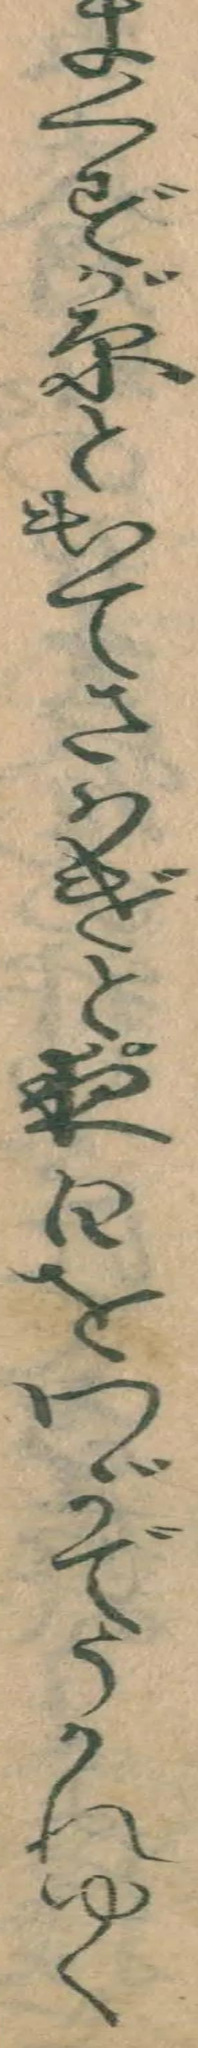まくずが原と出てさわげと。夜日をわがでうかれゆく
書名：新竹斎 5巻
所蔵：国立国会図書館 National Diet Library, JAPAN
